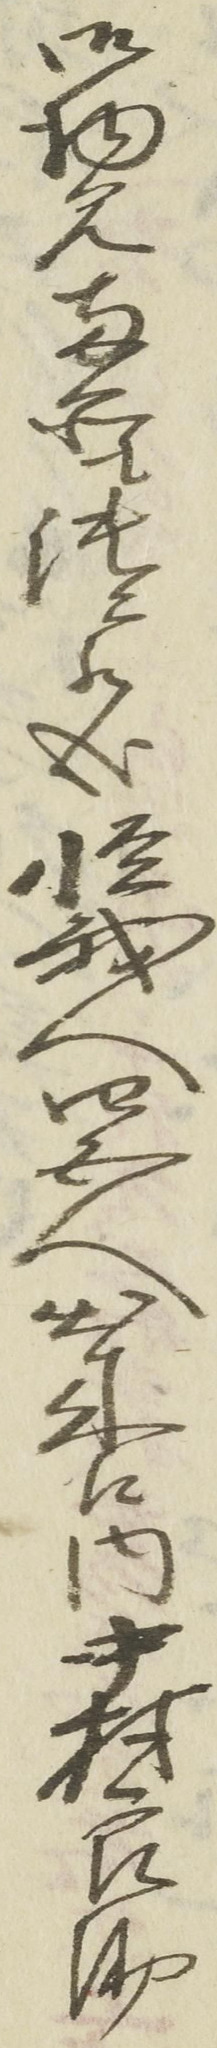御物見両所も潰ニ相成怪我人四五人出来候内中村良助
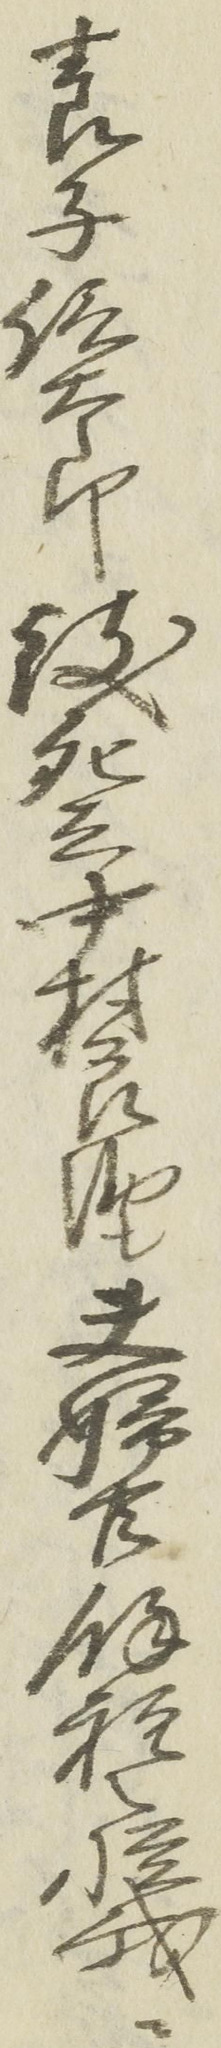養子信太郎致死去中村良助も夫婦共余程之怪我ニ
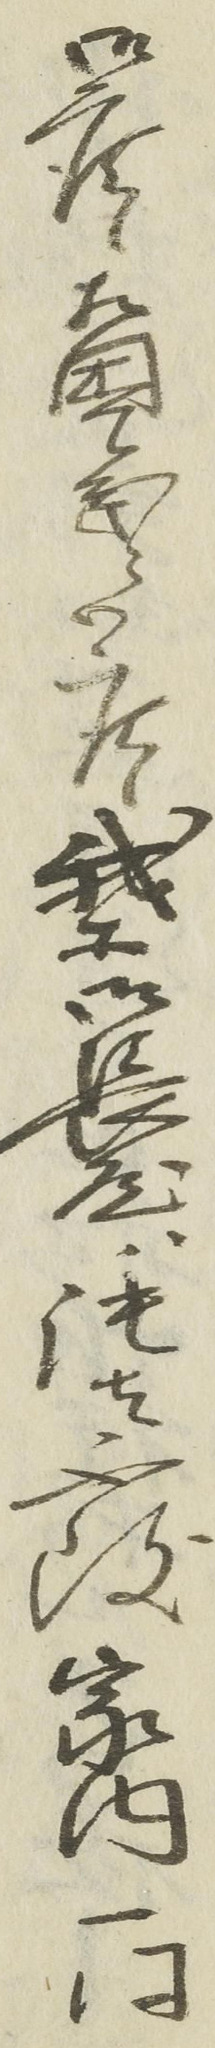御座候相困候義ニ御座候我等御長屋ハ潰は不致家内一同
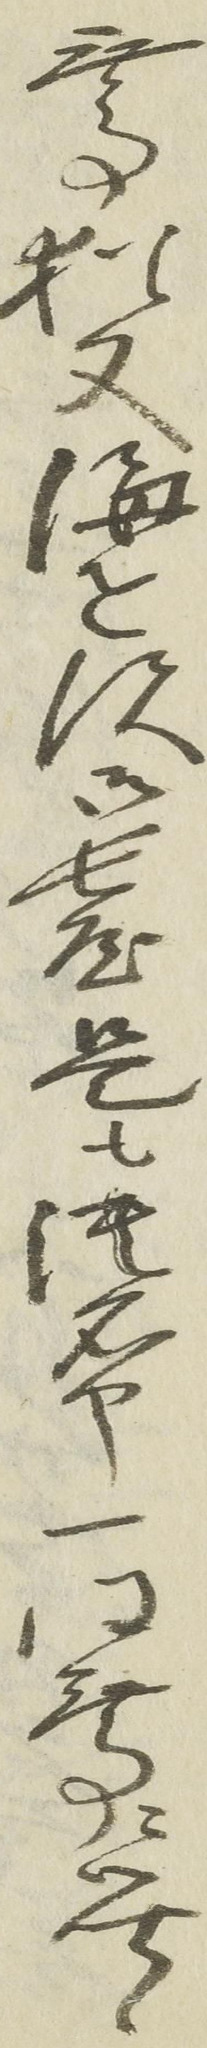無事猶又海と？沢？御長屋是も潰不申一同無事ニ御坐候
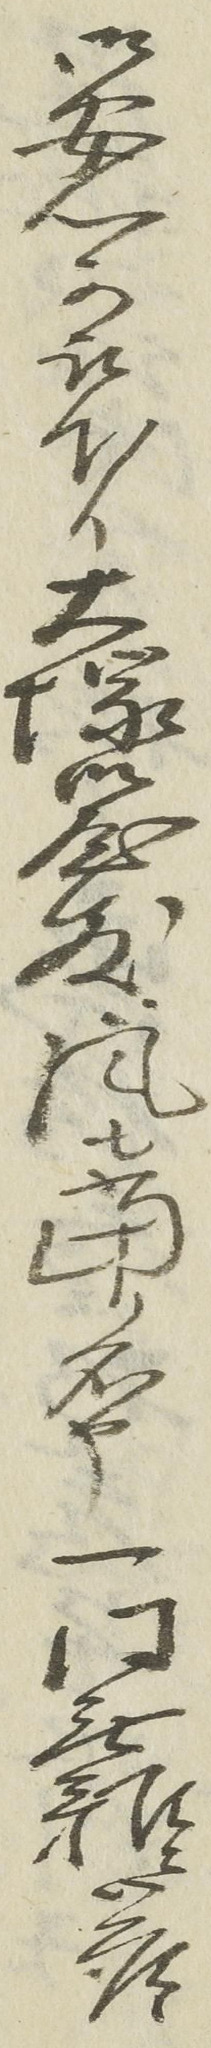御安心可被下候大塚御屋敷ハ風も当り不申一同無難ニ御座候
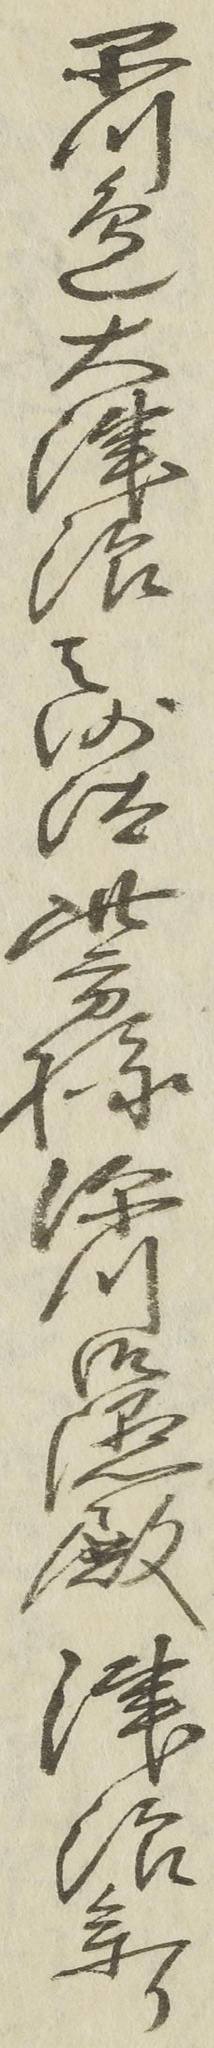品川辺大津浪は沙汰此方様深川御隠殿津浪参り
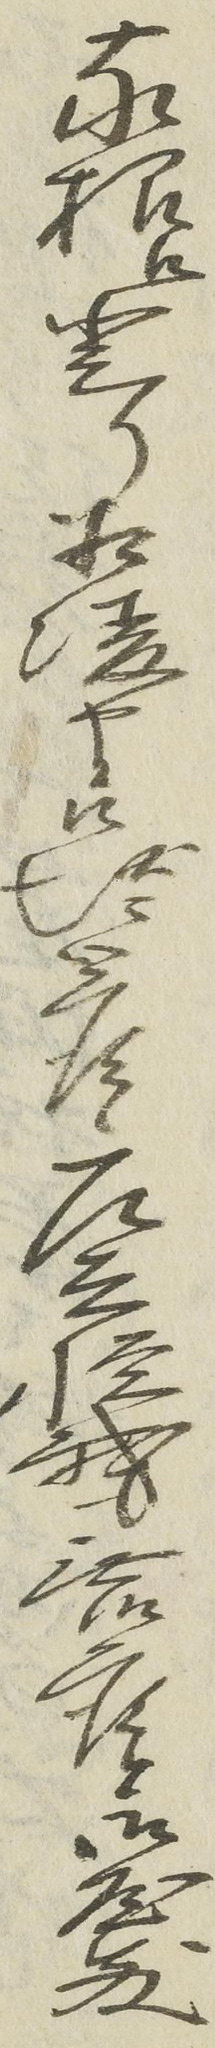家根江登り相凌申候趣ニ御座候乍去怪我も無御座候御屋敷
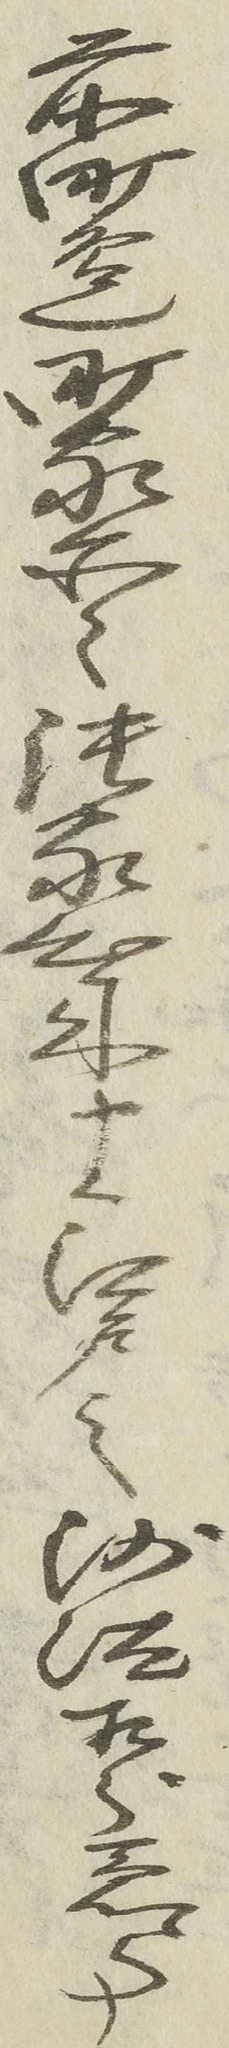前町辺町家所〻潰家出来申候江戸之沙汰相分兼候事
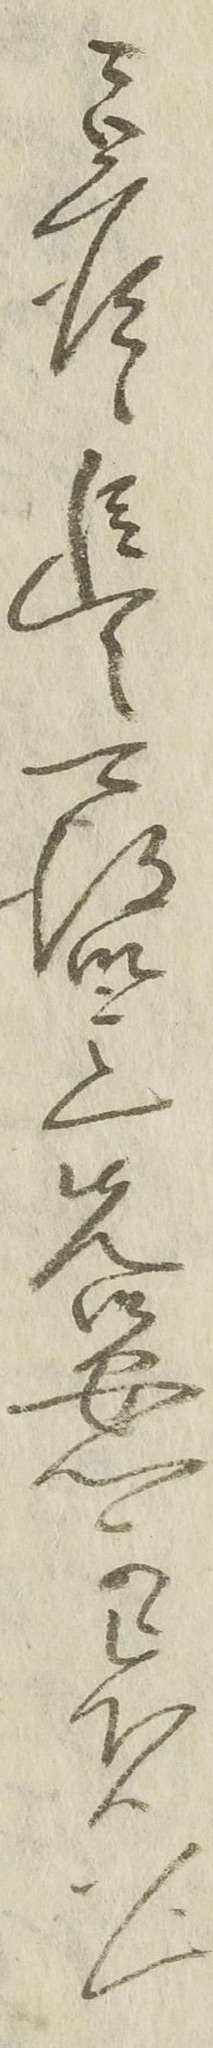ニ御座候追〻可得御意先御安心可被下候以上
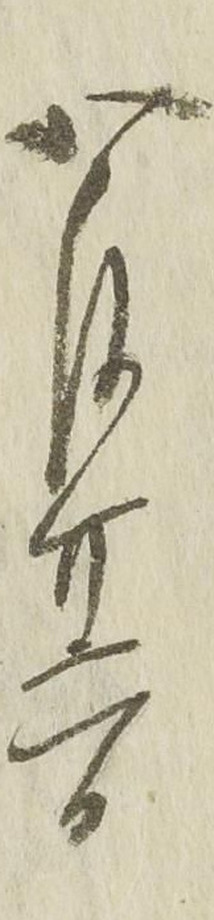八月廿六日

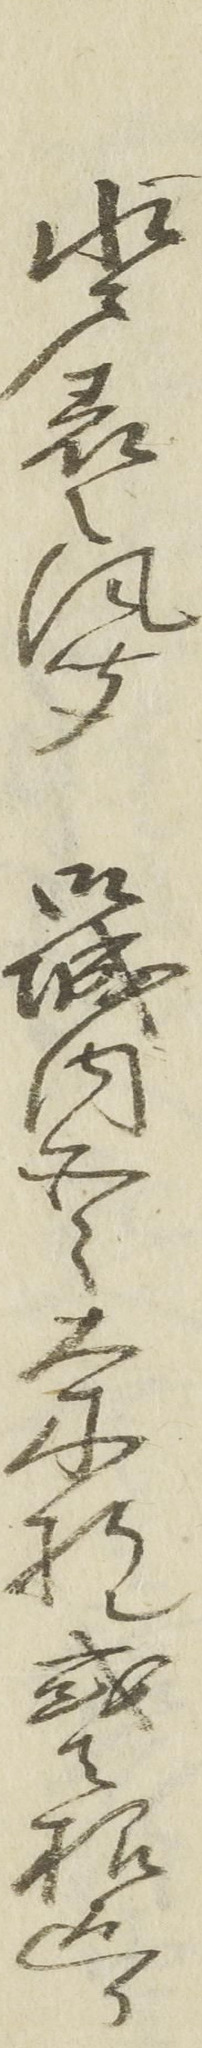一水戸表之風聞御城内所〻大木折レ或は根返り
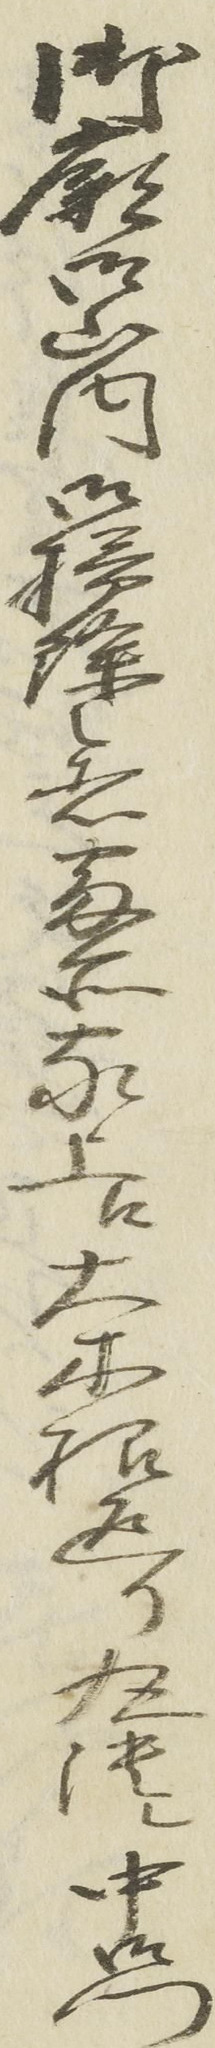御廟御山内御掃除之者番所家上江大木根返り丸潰レ中御門
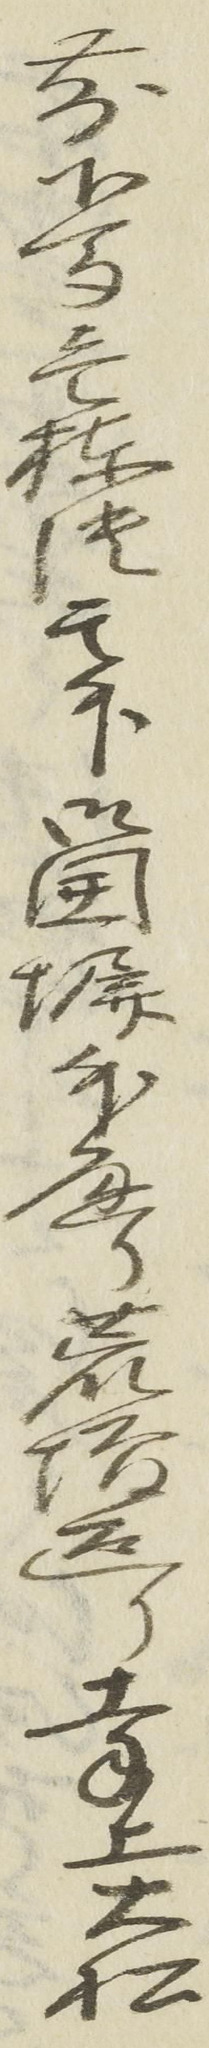前下馬壱棟潰其外御囲塀外通り荒増返り土手上大松
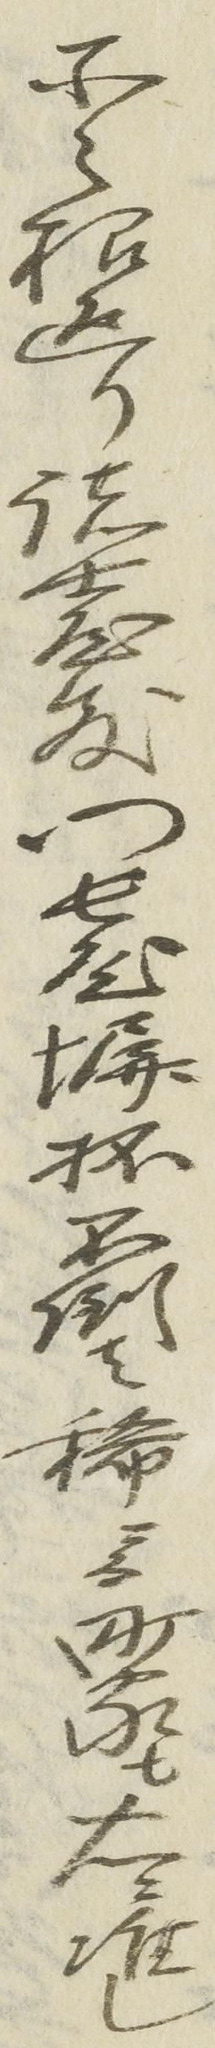所〻根返り諸士屋敷門長屋塀抔不倒は稀ニ而町家も右ニ准し
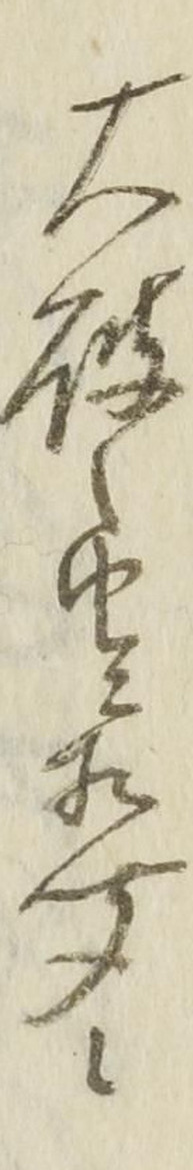大破之由ニ相聞候
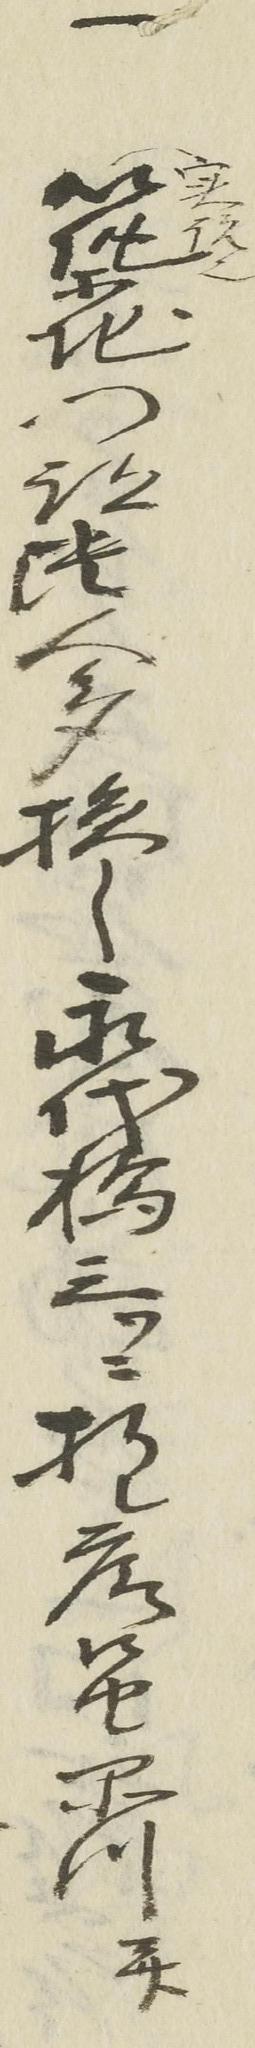一築地門跡潰人多損し永代橋三ツニ折れ落候由品川并
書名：安政乙卯江戸大地震筆記　安政丙辰八月大阪大雷雨之記追加　安政三辰年七月松前辺大地震并八月大風雨記録
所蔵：東京大学地震研究所図書室 Earthquake Research Institute Library, The University of Tokyo, JAPAN
